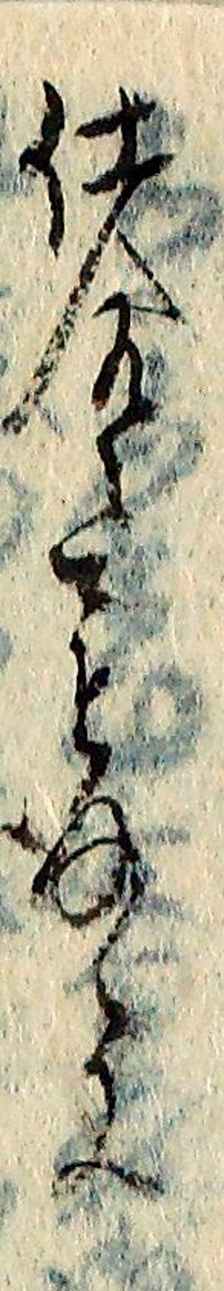仕合に可奉存候以上
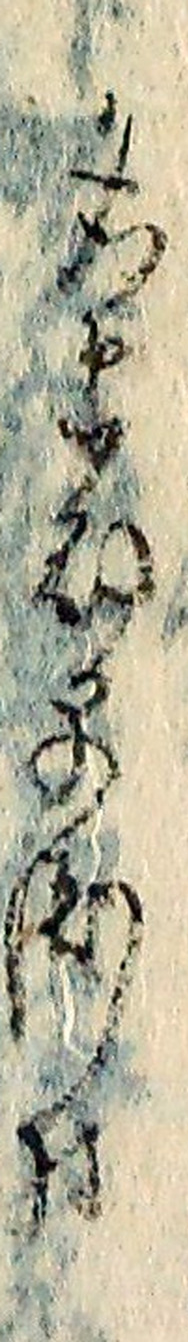名東郡早淵村
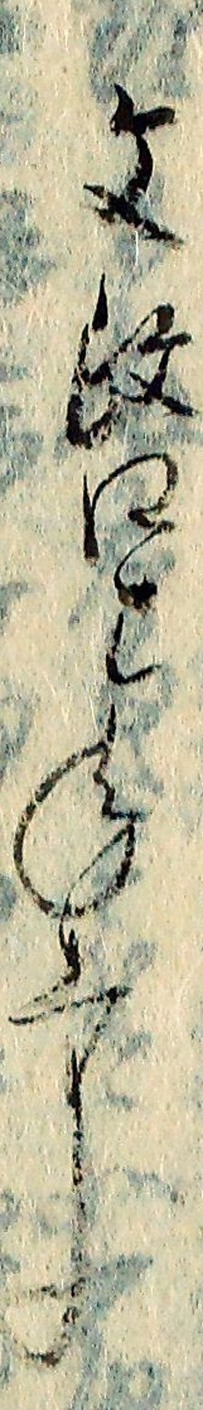文政四巳年十一月
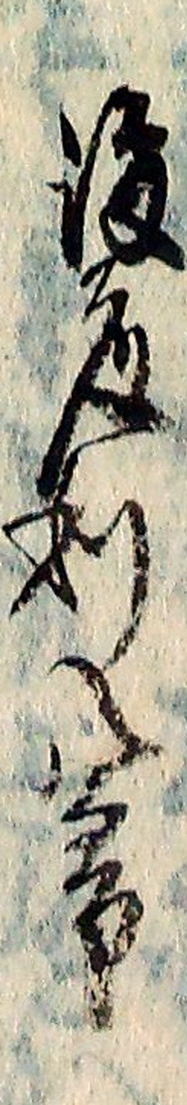後藤利八郎
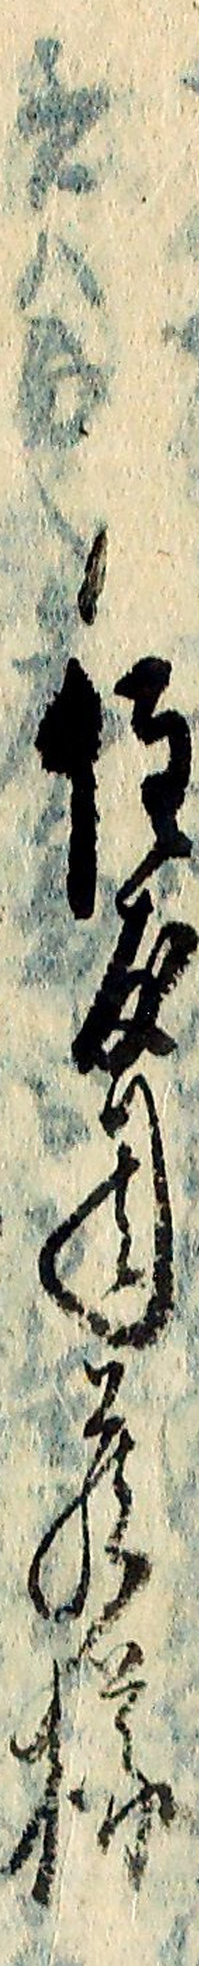住友周蔵様
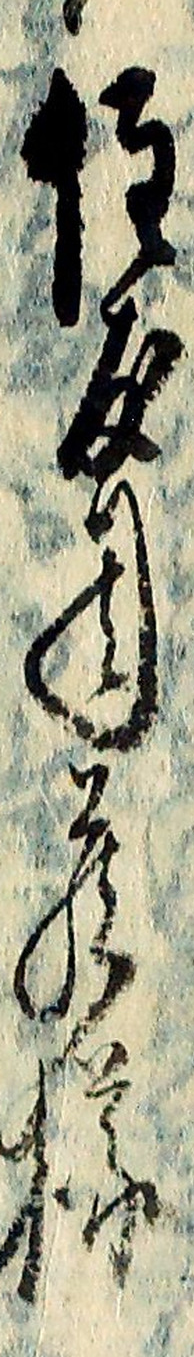住友周蔵様
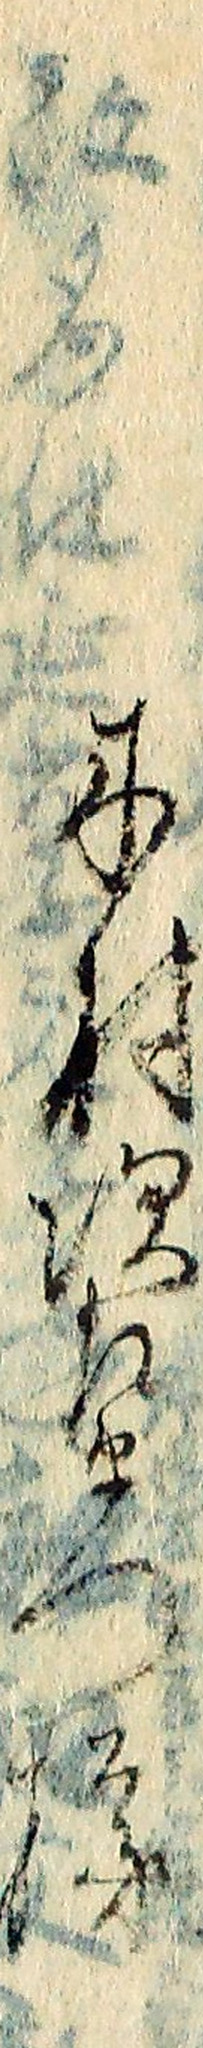木村次左衛門様
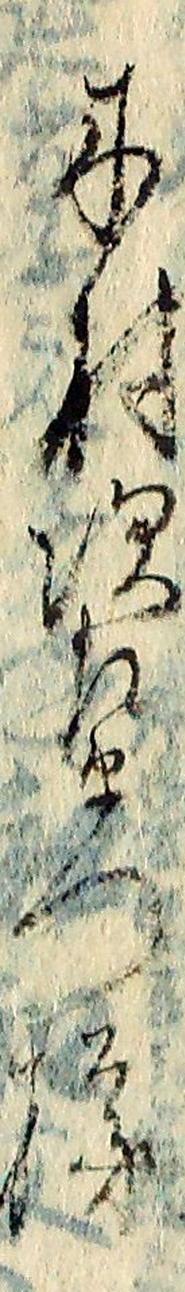木村次左衛門様
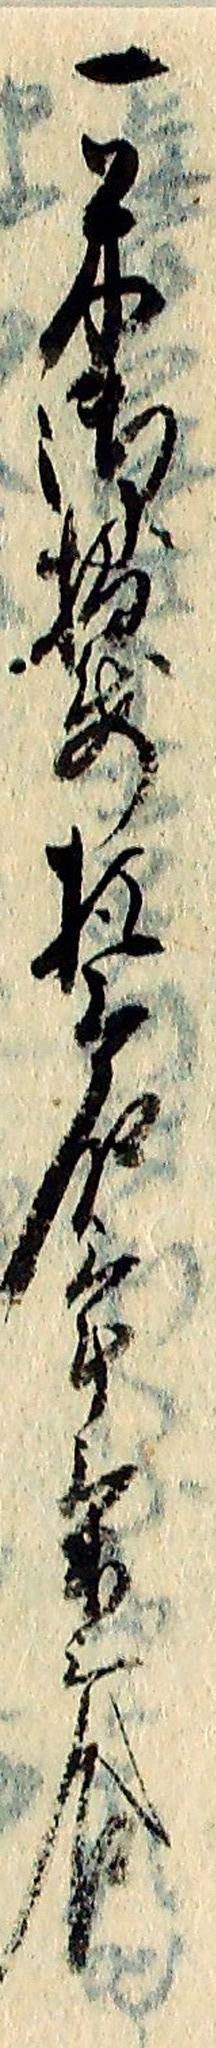一米御指紙拾三石三斗三升三合
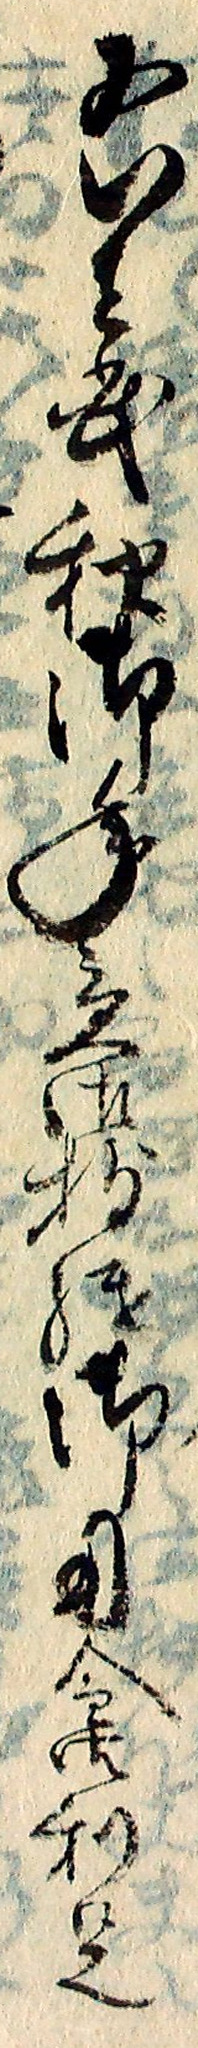右は当秋御年貢御指継御用金御利足
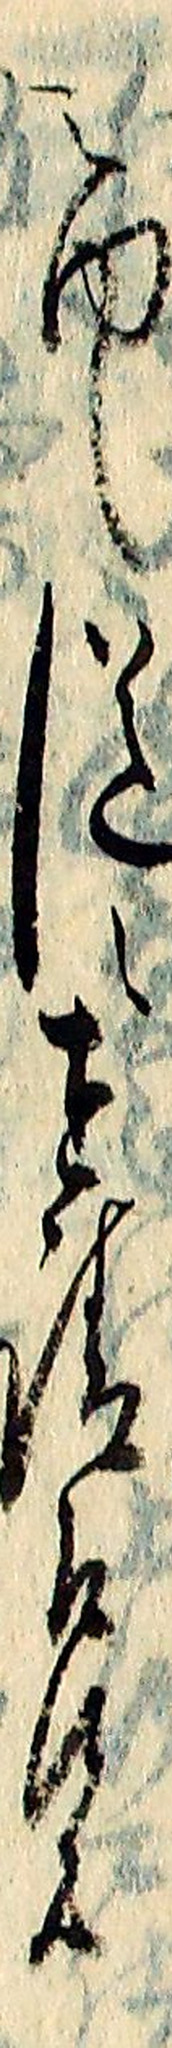之内へ慥に奉請取候以上
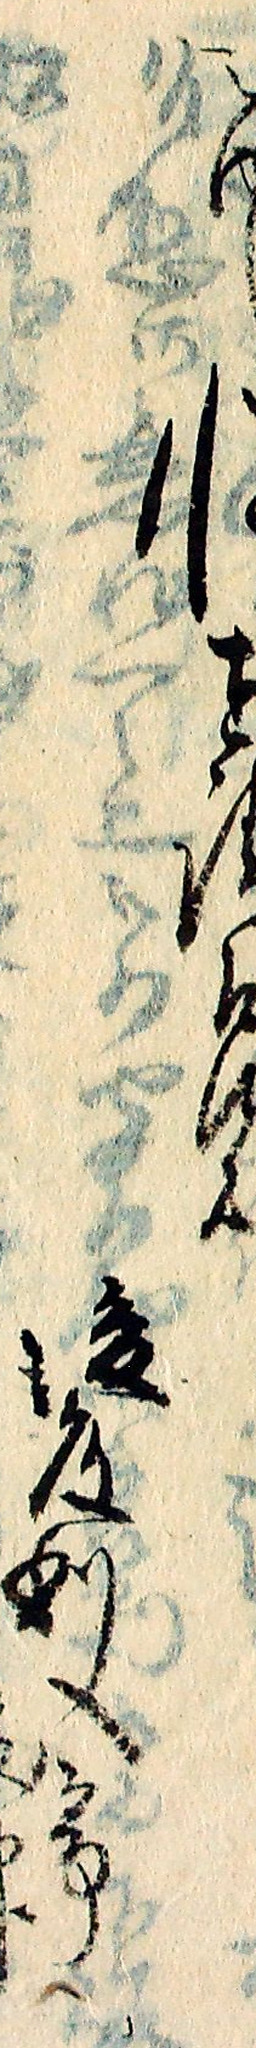後藤利八郎
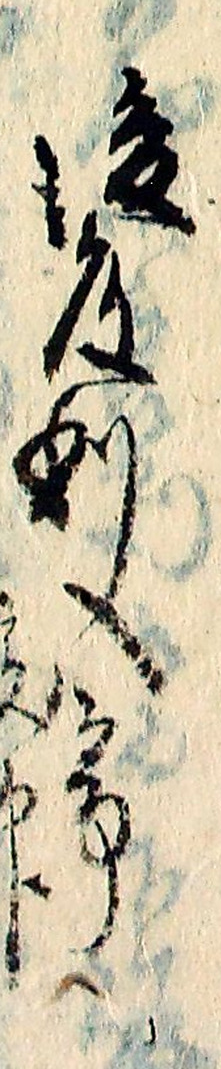後藤利八郎
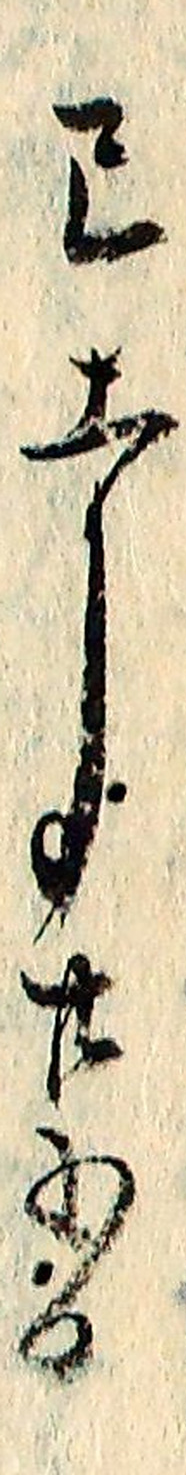巳十一月廿五日
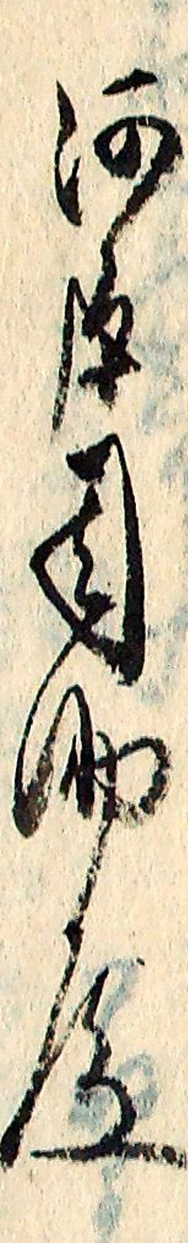河原周助殿
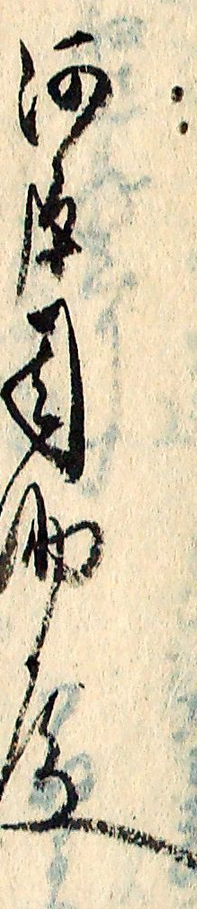河原周助殿
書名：諸御願書控(後藤氏壱番）
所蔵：鳴門教育大学 Naruto University of Education
